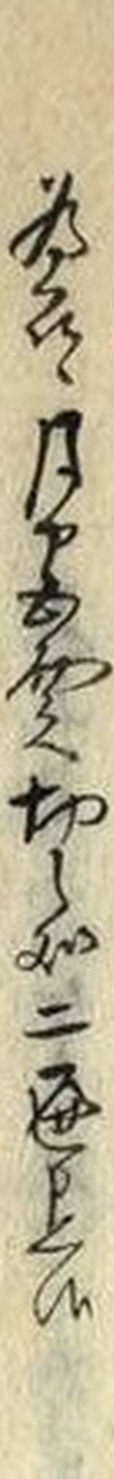為召候月宮殿切之処二遍申上候
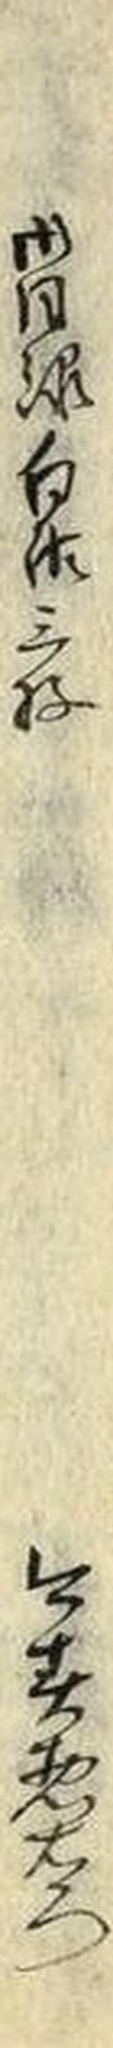御目録白銀三枚今春惣右衛門
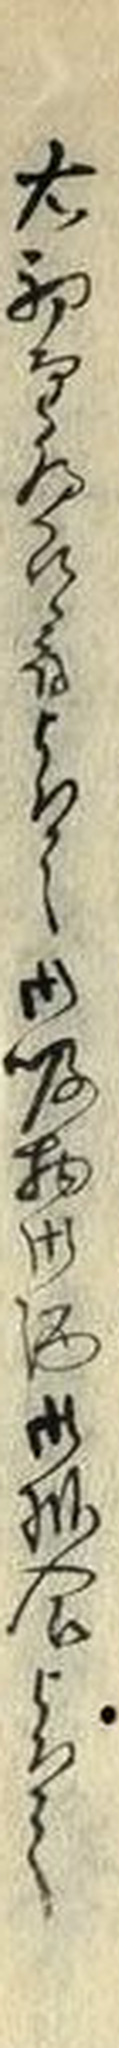右初而被為召候ニ付被下之御吸物御酒御掛合被下之
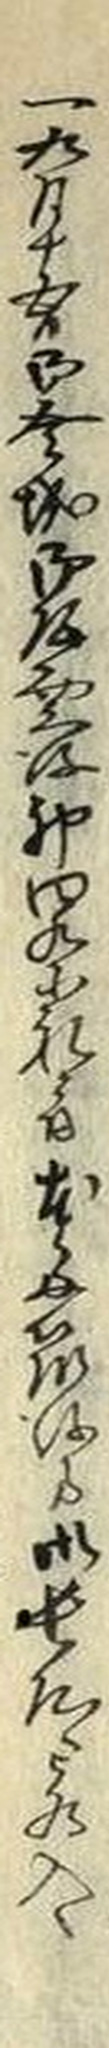一九月十五日御登城御帰殿後神田祭礼ニ付本多筑後方御長屋へ被為入候
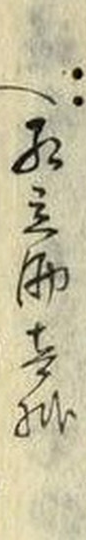紅立助壱掛
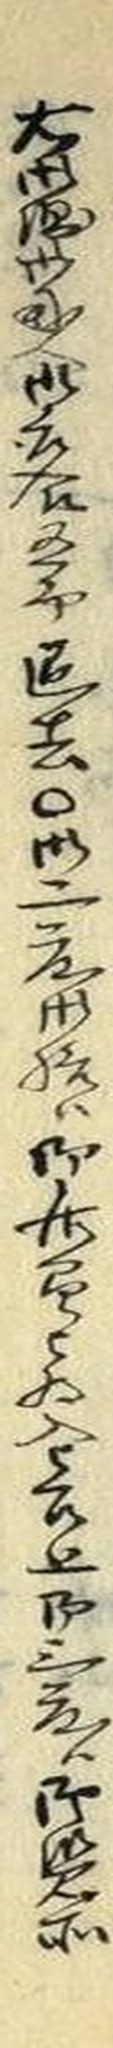右御側御用人於取合有而退去〇御二度御膳ハ御居間へ被為入被召上御三度ハ御覧所
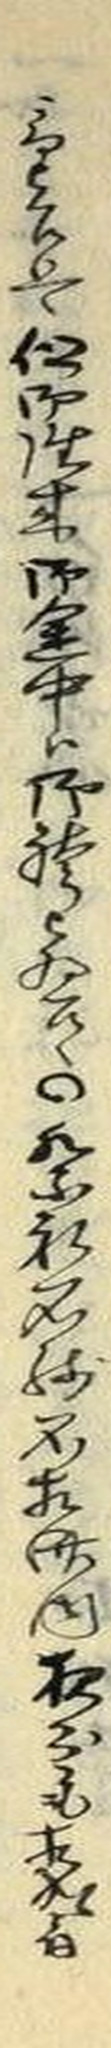ニ而被召上候但御往来御途中ハ御袴被為召候〇祭礼不残不相済内夜分ニも相成候ニ付
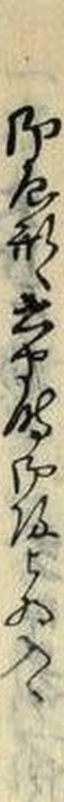御屋形へ六半時御帰被為入候
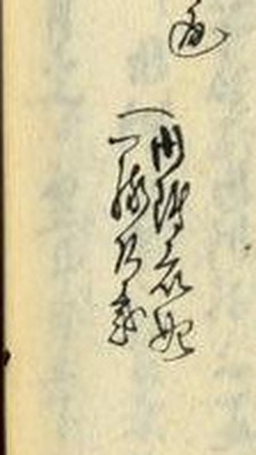一統頂戴
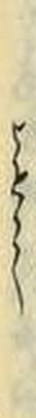被進之
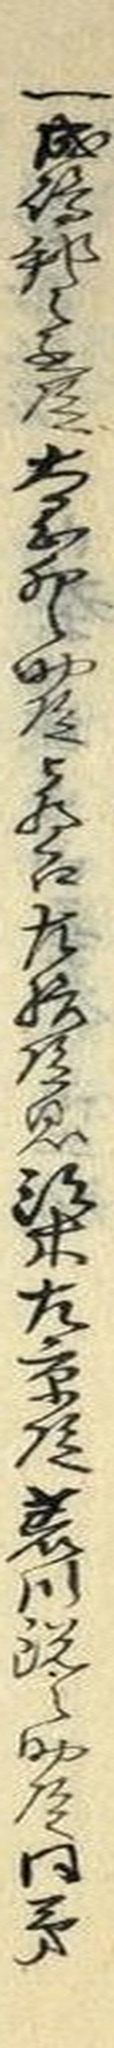一成嶋邦之丞殿大岡卯之助殿被為召左膳殿息鈴木左京殿荒川鋭之助同弟
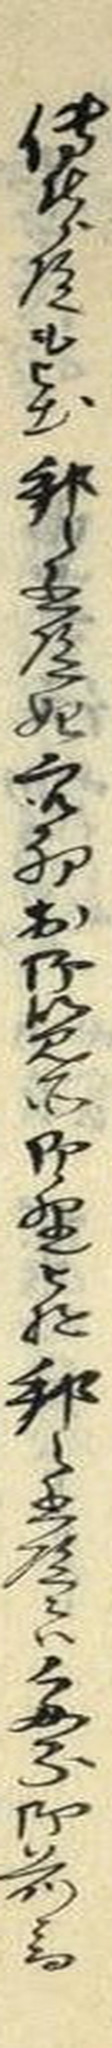伝次郎殿も被出邦之丞殿始最初於御覧所御逢被遊邦之丞殿ニハ多分御前ニ而
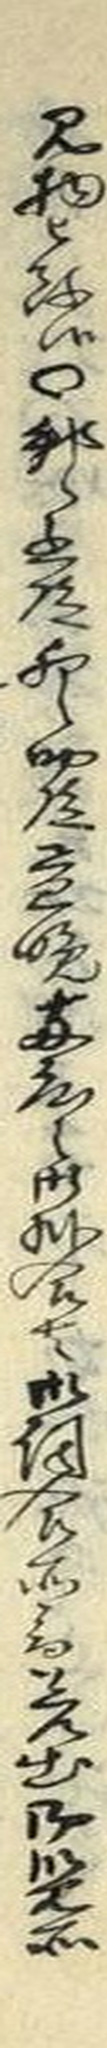見物被致候〇邦之丞殿卯之助殿昼晩両度之於掛合者御調合所ニ而差出御覧所
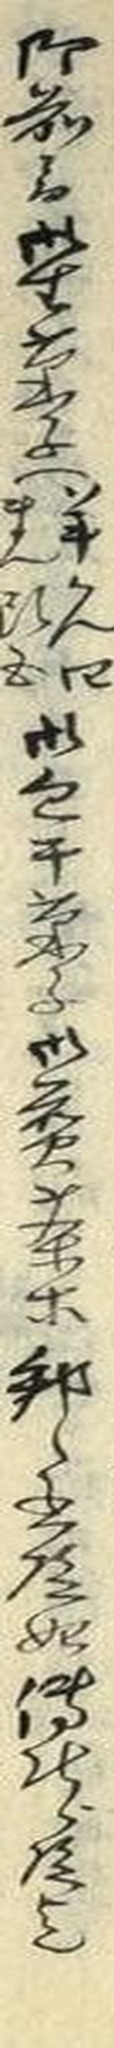まん頭五御包干菓子御煎茶等邦之丞殿始伝次郎殿迄
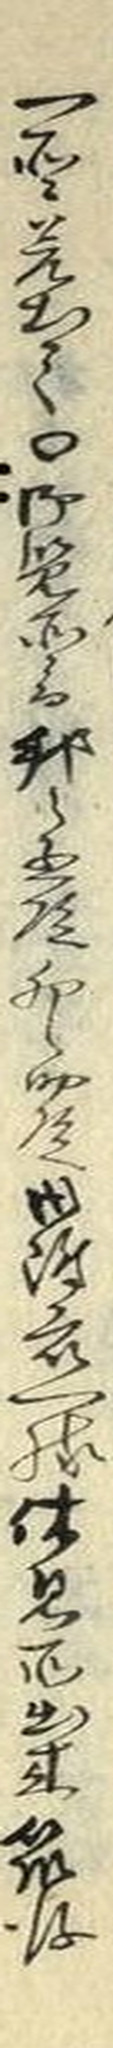一所ニ差出之〇御覧所ニ而邦之丞殿卯之助殿御附衆一縁休息所出来筑後
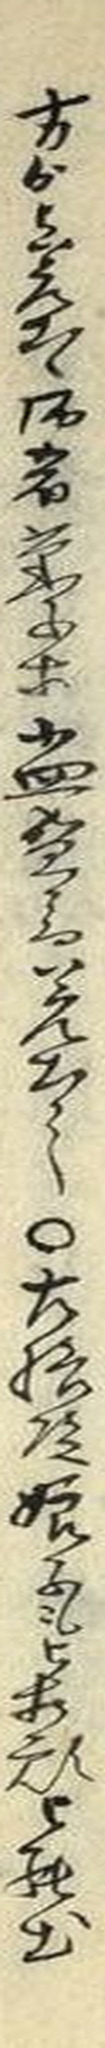方ゟ被差出候酒肴菓子等小皿盛ニ而差出之〇左膳殿娘子も被相願被罷出
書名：少傅日録抄（斉善付側向頭取日記、在府）
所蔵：福井県文書館 Fukui Prefectural Archives
